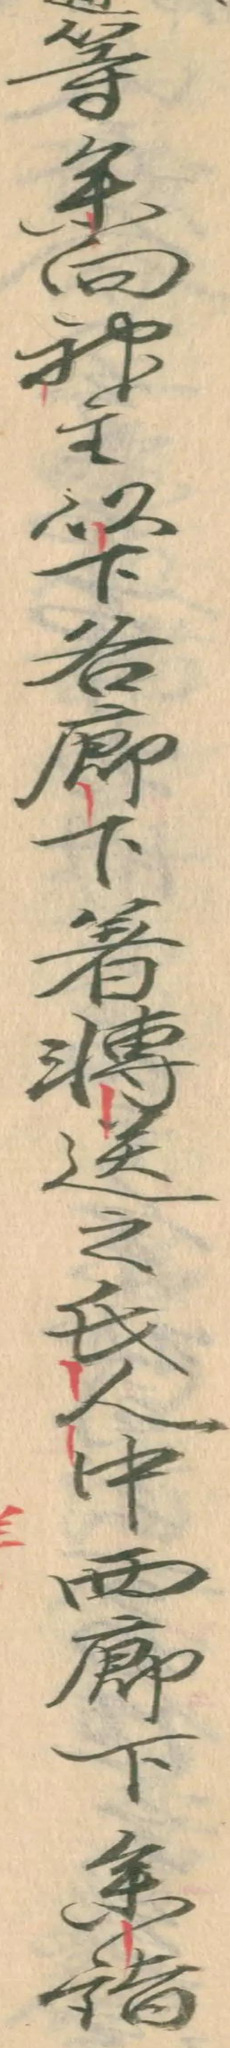等参-向神_主以-下各廊-下着転-送之氏西廊下参-詣
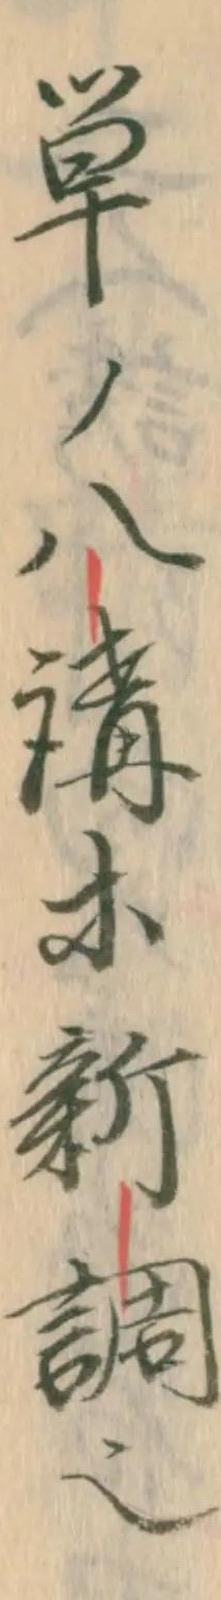単ノ八-講等新-調也
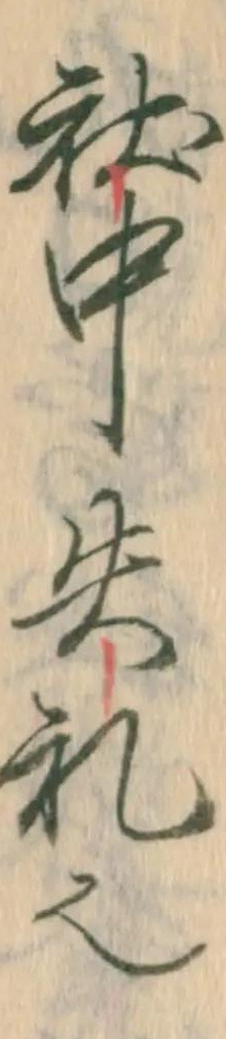社-中失-礼也
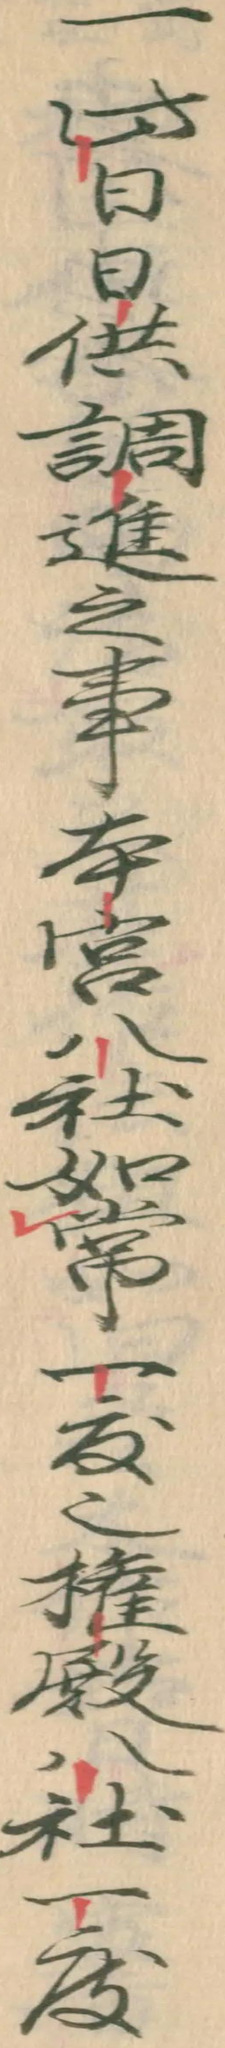一此_日日-供調-進之事本-宮八-社如常一-度也権-殿八-社一-度
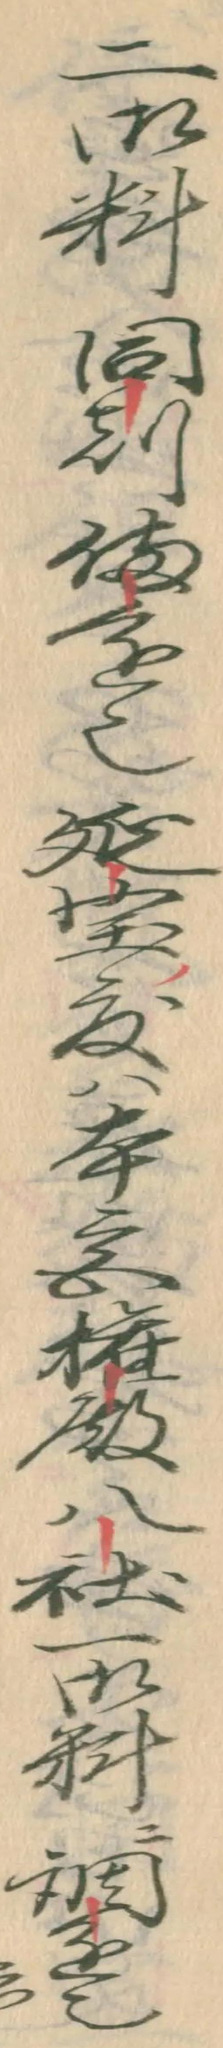二御料同-刻備-進也延-宝度ハ本宮権-殿八-社一御料ニ調-進也云々
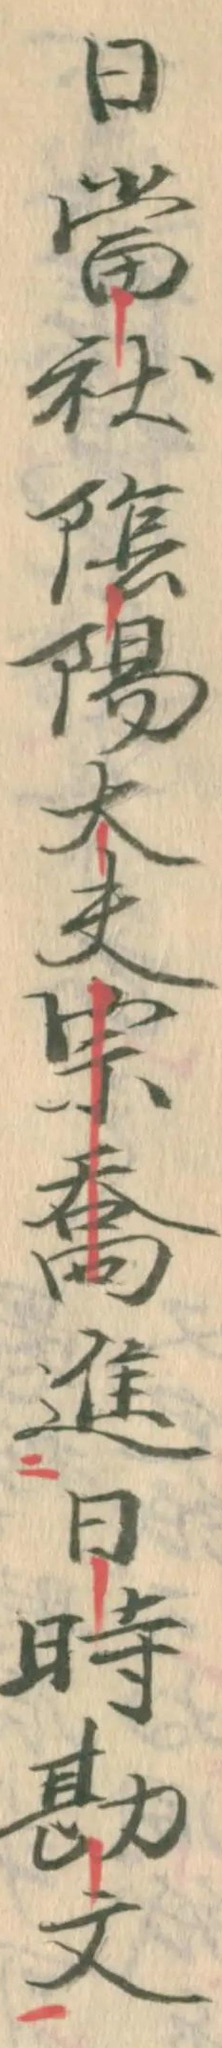日当-社陰-陽大-夫宗喬進日-時勘-文
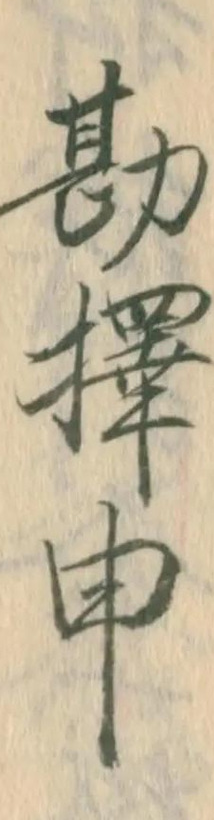勘択申
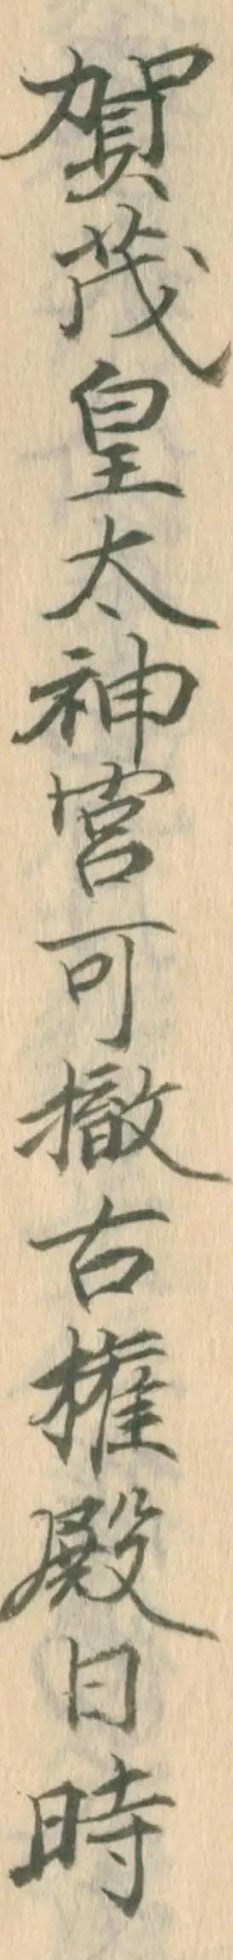賀茂皇太神宮可撤古権殿日時

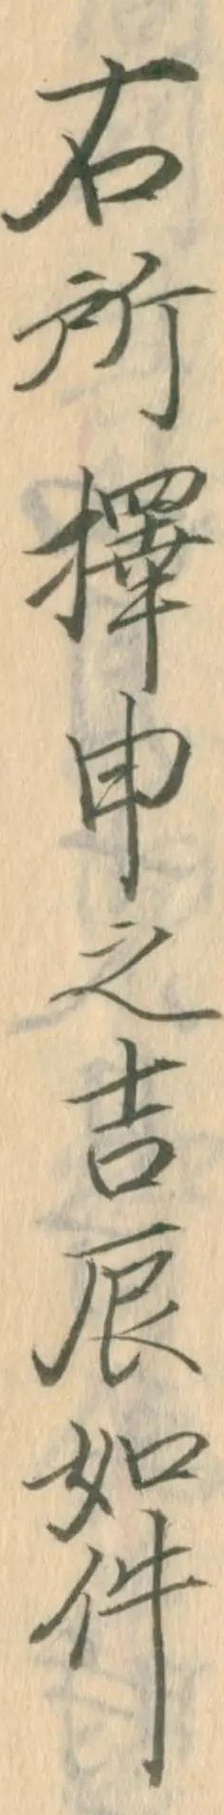右所択申之吉辰如件
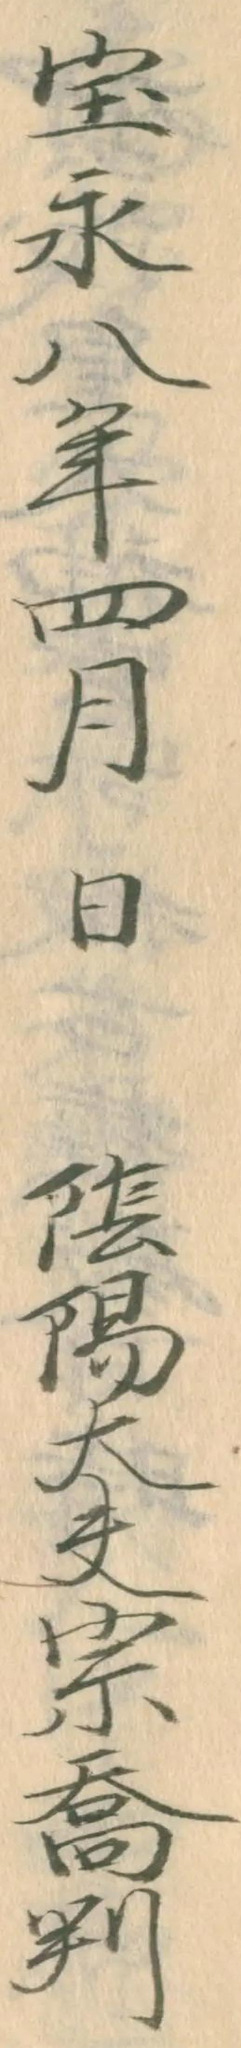宝永八年四月日陰陽大夫宗喬判
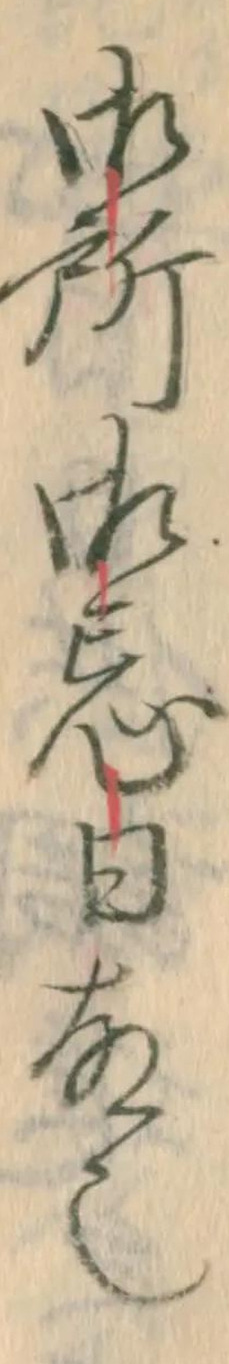御-所御-忌-日故也
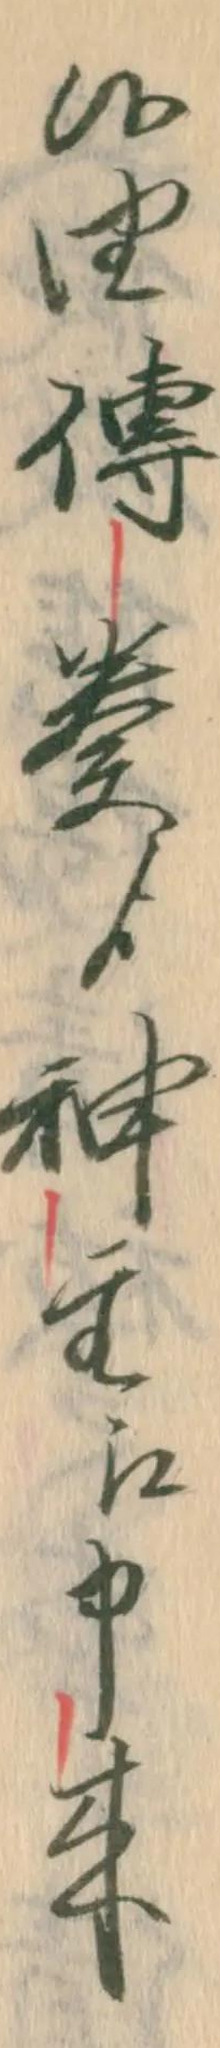候由伝-奏ゟ神-主江申_来
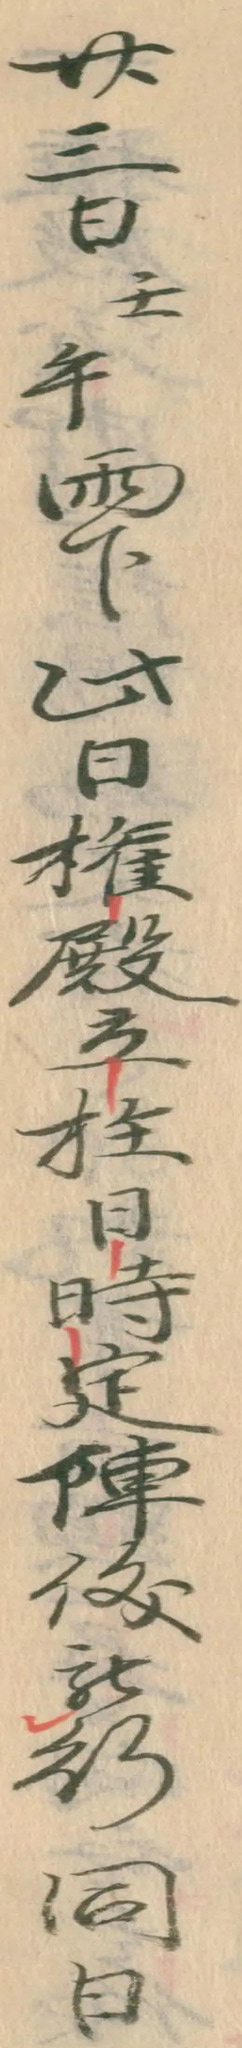廿三日壬午雨下此日権-殿立-柱日-時_定陣儀被行同日
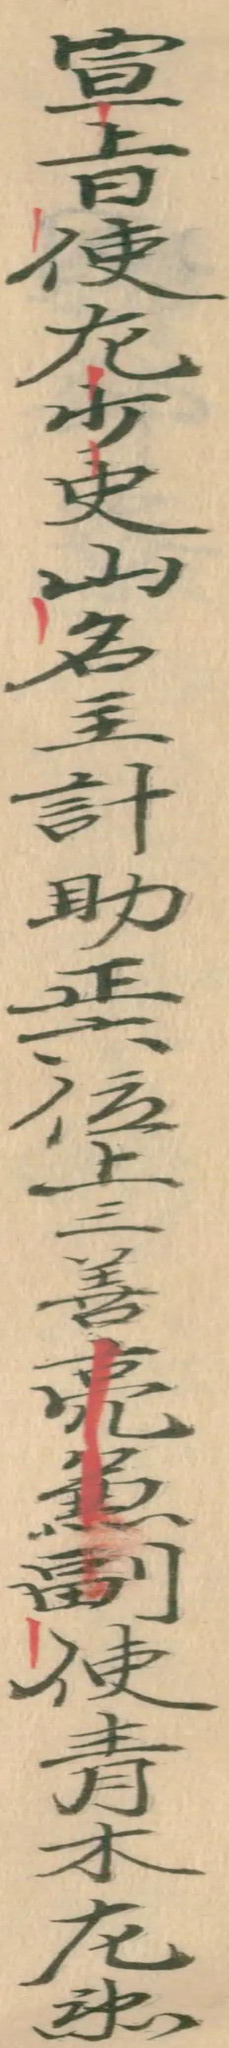宣-旨_使左-少-史山_名主計助正六位上三善亮兼副_使青木左衛
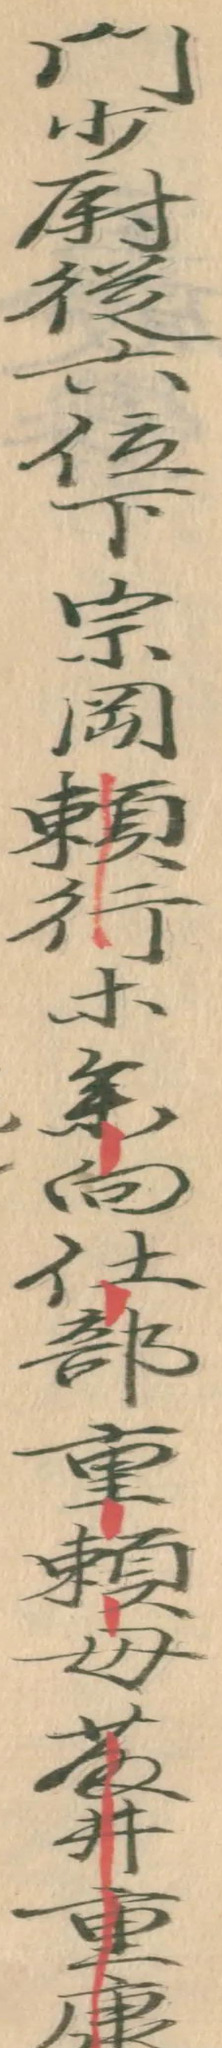門少尉従六位下宗岡頼行等参-向仕-部重-頼-母藤井重康
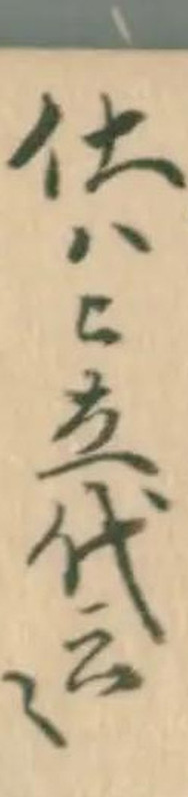仕ハ被立代云々
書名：賀茂社記録. 第15冊
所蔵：国立国会図書館 National Diet Library, JAPAN
